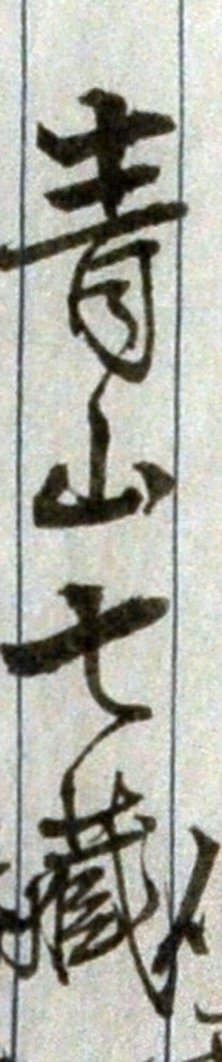青山七蔵
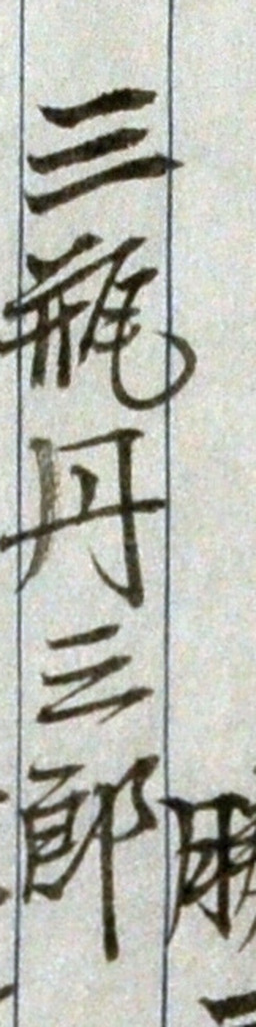三瓶丹三郎
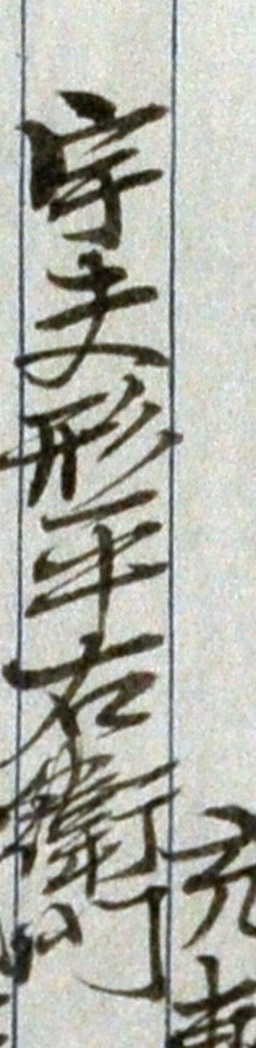宇夫形平右衛門
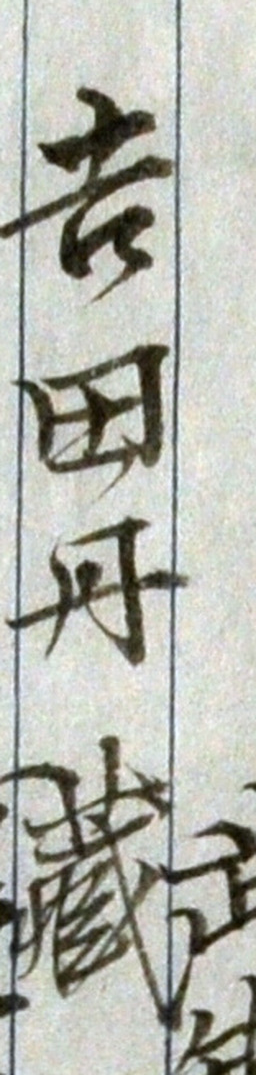吉田丹蔵
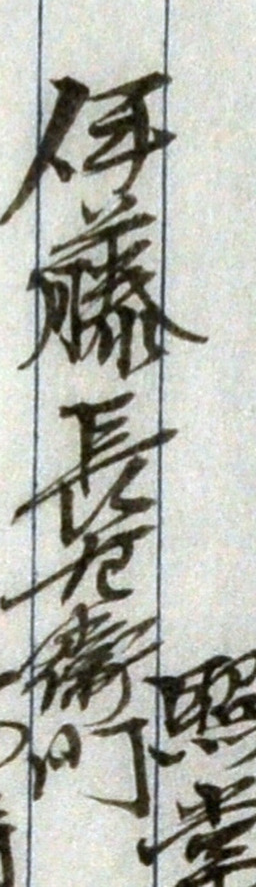伊藤長左衛門
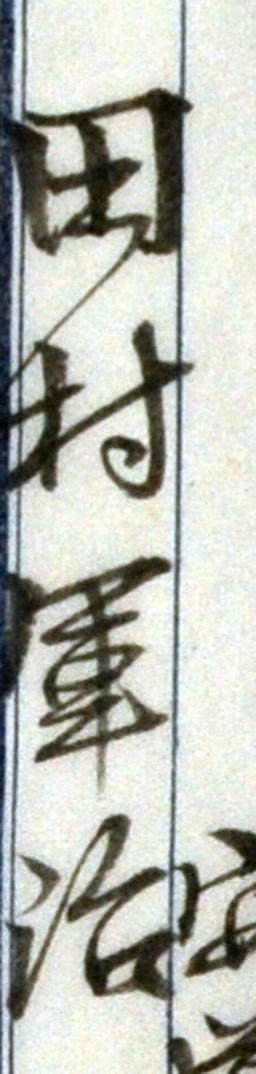田村軍治
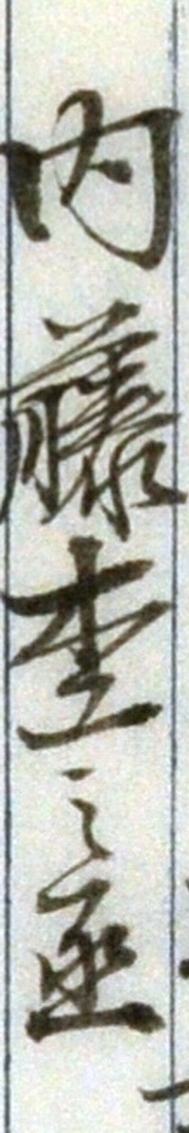内藤杢之丞
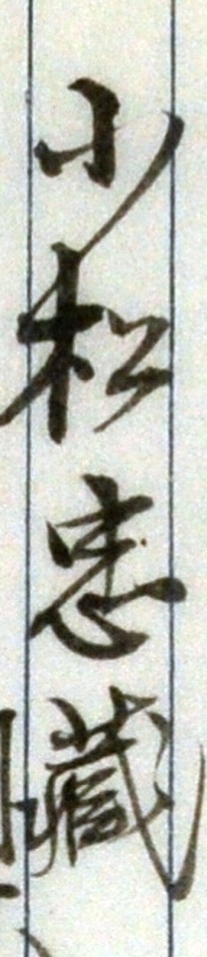小松忠蔵
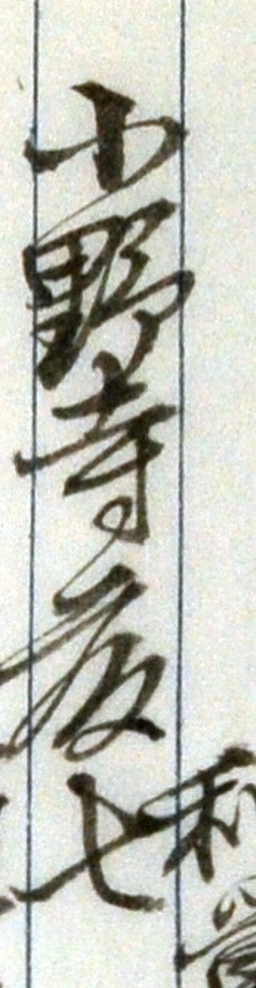小野寺藤七
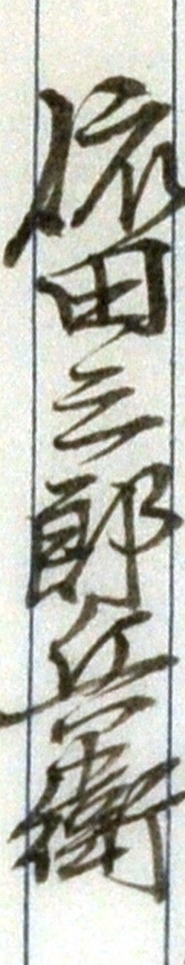依田三郎兵衛
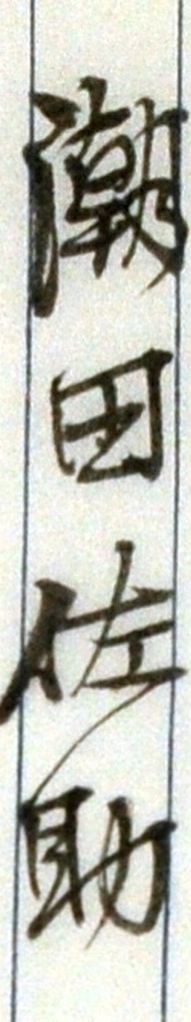潮田佐助
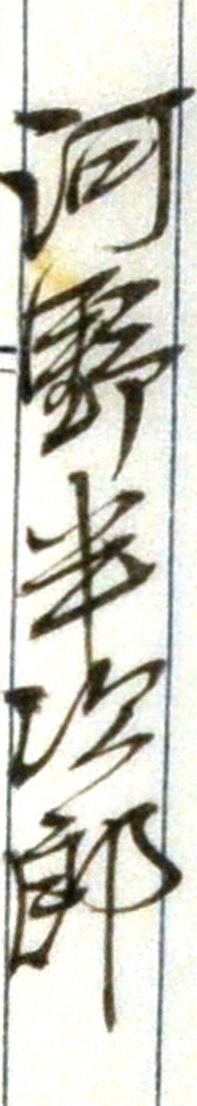河野半次郎

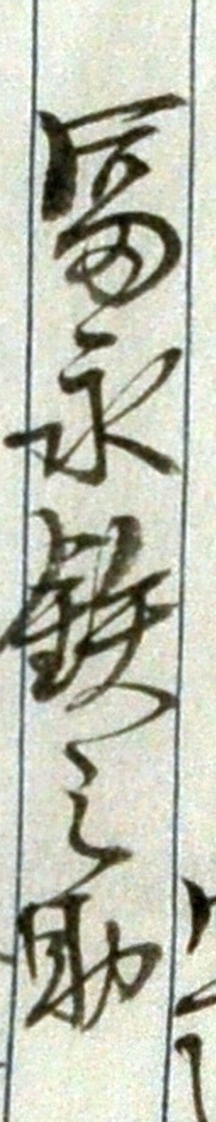富永鉄之助
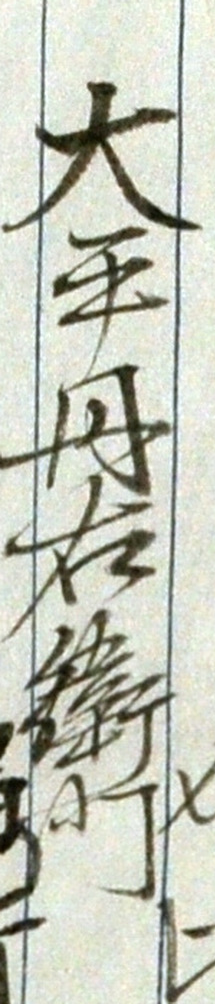大平丹右衛門
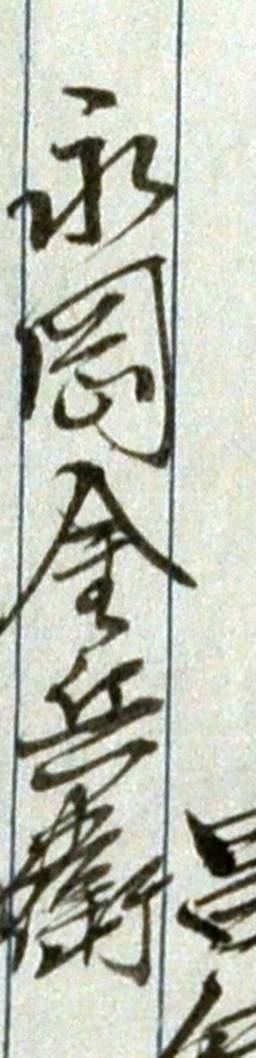長岡金兵衛
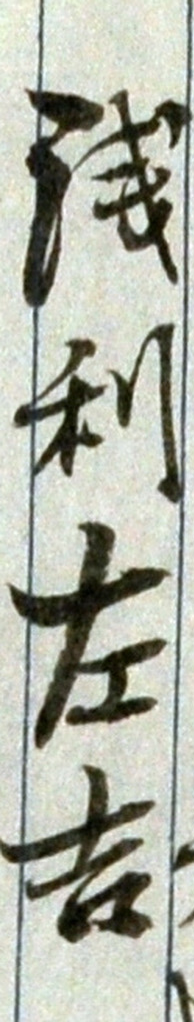浅利左吉
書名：竹内流・甲州流・荒木流・一刀流新当流起請文及免許写堤宝山流手鏡及個之大事
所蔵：伊那市立高遠町図書館・合同会社AMANE
